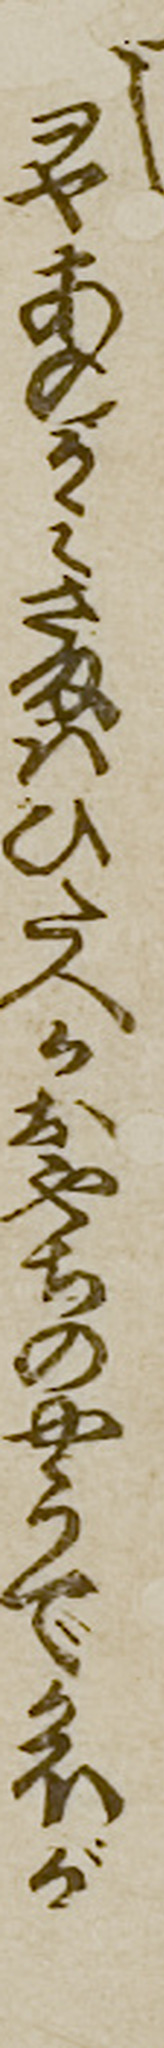〽ヲヤあのかみさまはひたへかおやちのやうでかほが
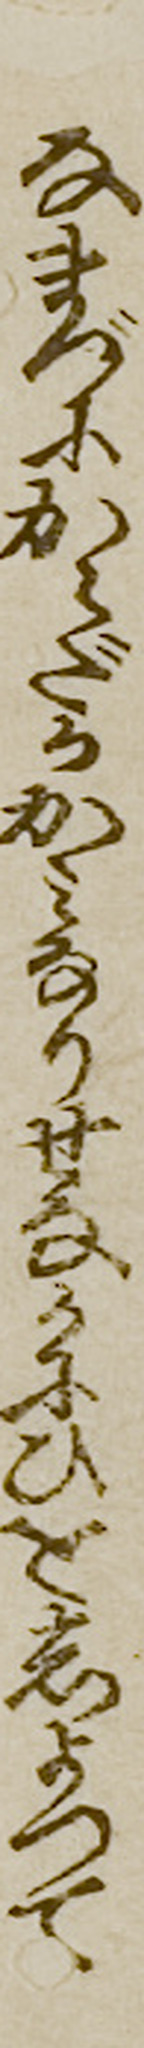なまづにからだかかみなりせなかにひをしよつて
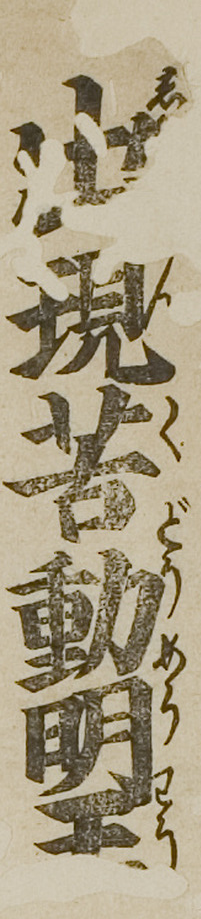出現苦動明王
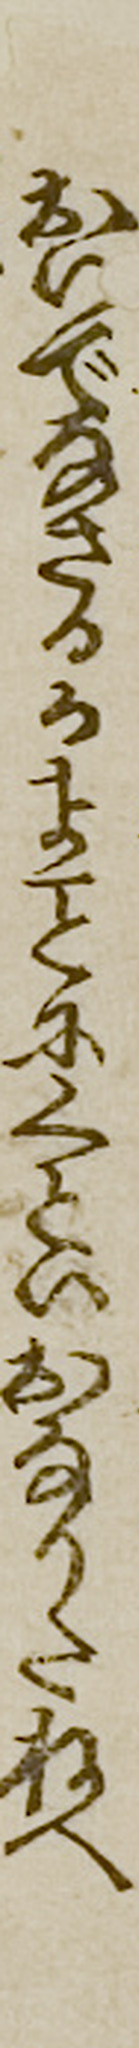おいでなさるかまことにくといおなりたねへ
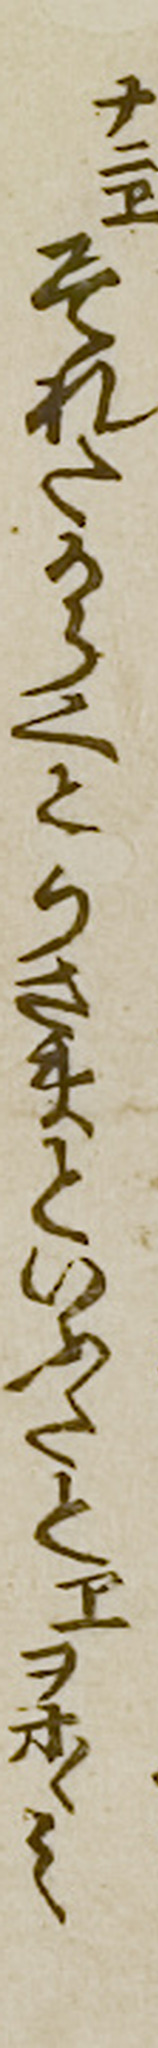ナニヱそれたからくとうさまといふたとヱヲホヽ〳〵
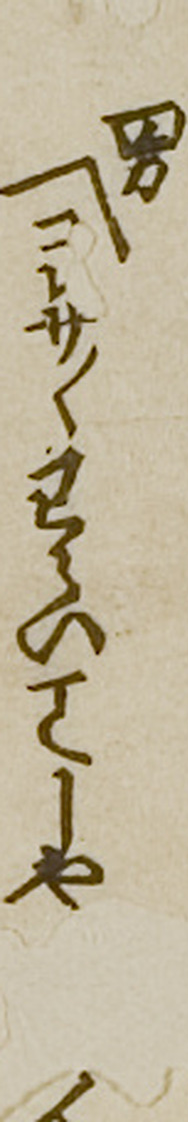〽コレサ〳〵わらいことしやへ
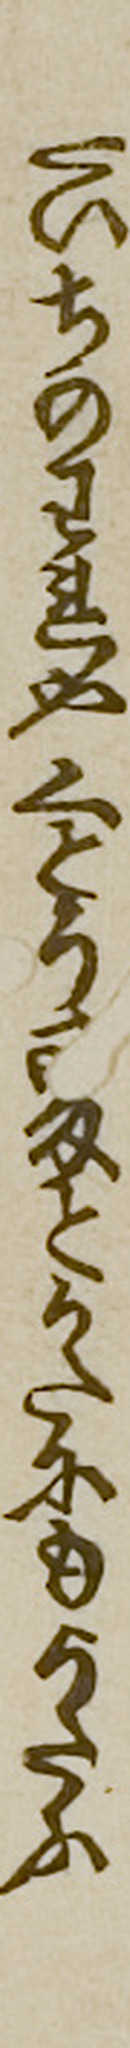くいちのわれやくとうさまとかたにもかたふ
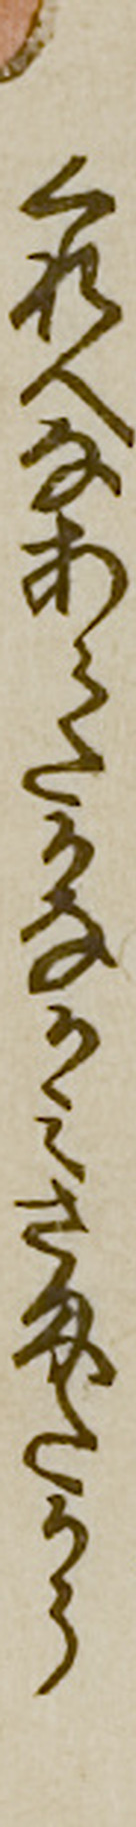くれへなあらたかなかみさまたから
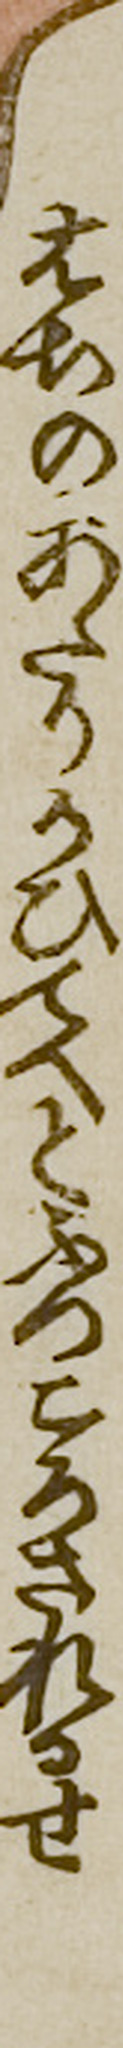はちのあたりかひてへとふつころされるせ
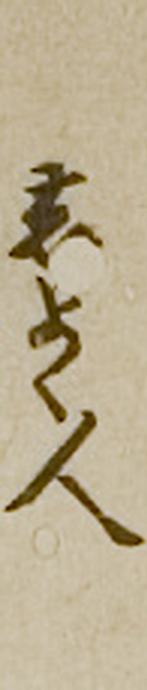しよく人
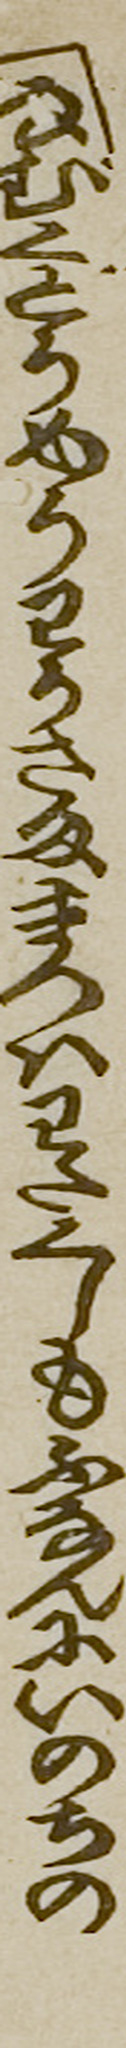〽なむくとうめうわうさままつはわたくしもふなんにいのちの
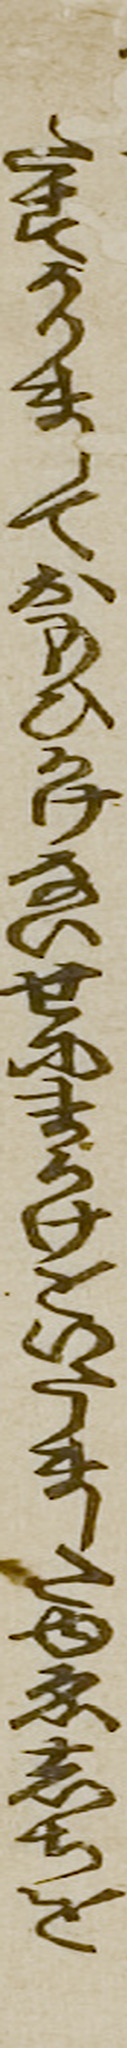たすかりましておもひかけないせにまかけをいたしましたゆゑしちを
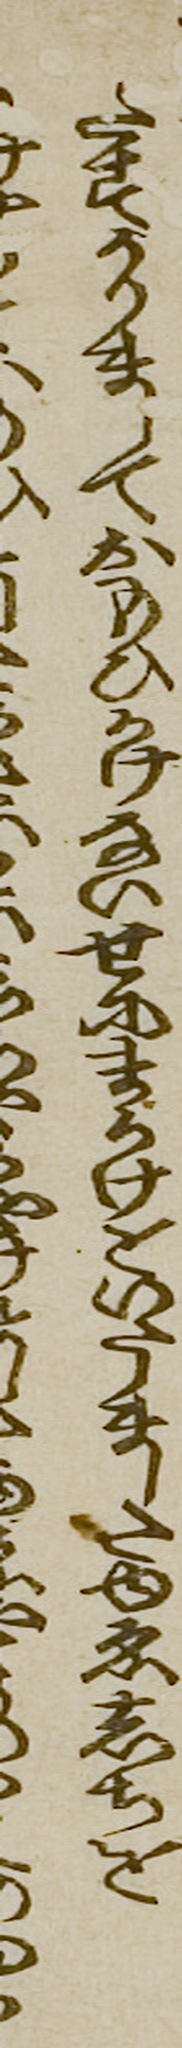たすかりましておもひかけないせにまかけをいたしましたゆゑしちを
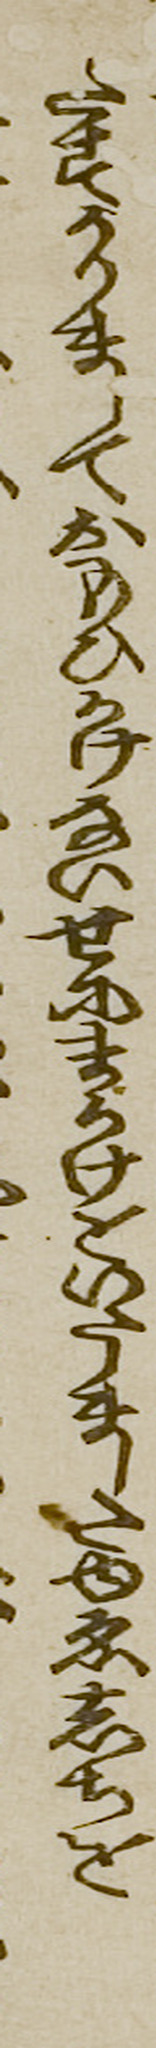たすかりましておもひかけないせにまかけをいたしましたゆゑしちを
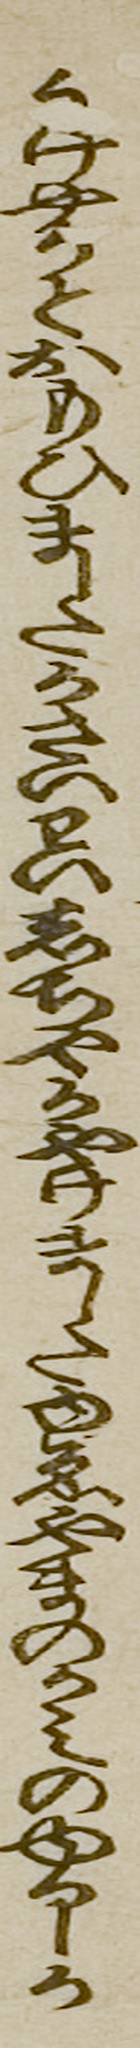うけやうとおもひましたかさいわいしちやかやけましたゆゑやまのかみのゆるしか
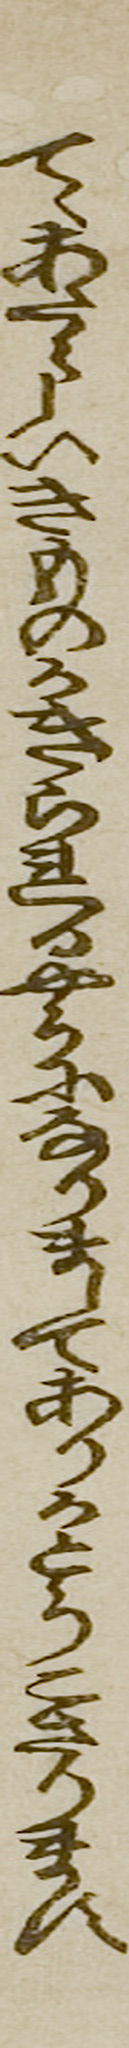てゝあたらしいきものかきられるやうになしましてありかとうこさります
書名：出現苦動明王
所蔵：東京大学総合図書館 General Library in the University of Tokyo, JAPAN
